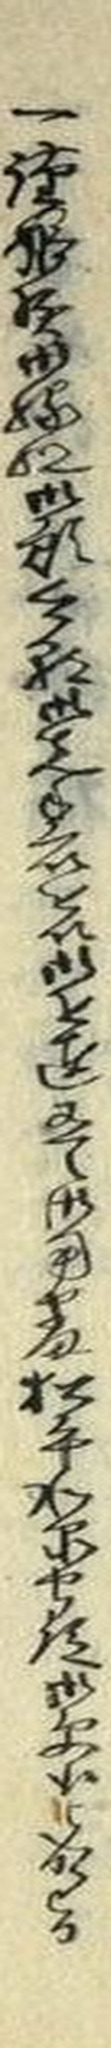一謹姫様御縁組御願今朝御先手衆を以御進達有之御用番松平和泉守殿御受取被成候旨

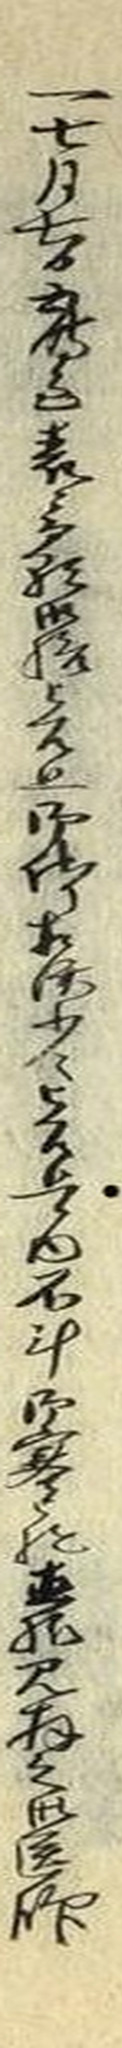一七月七日五時過表ニ而朝御膳被召上御代り相済少々被召上候内不計御塞被遊直様見拝之御医師
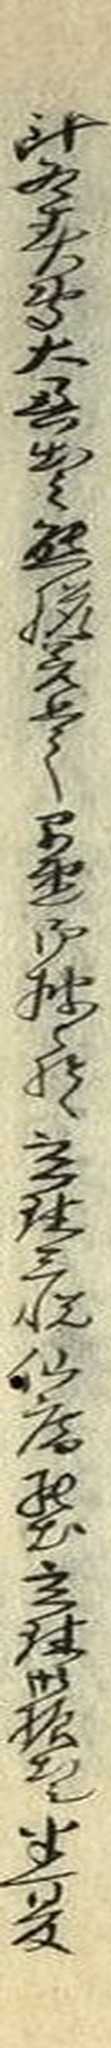針谷春専大奥出之熊膽差上之早速御披被遊候玄珪三悦仙庵罷出玄珪御振出シ半夏
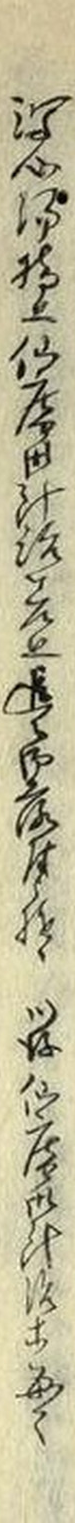瀉心湯指上仙庵御針治差上追々御落着被遊候以後仙庵御針治等毎々
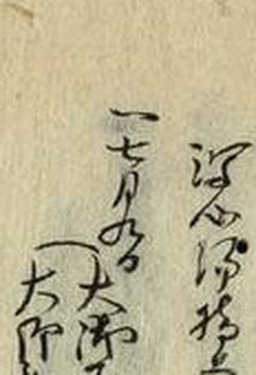一七月九日
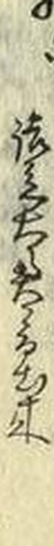詰立大奥ニ而出来
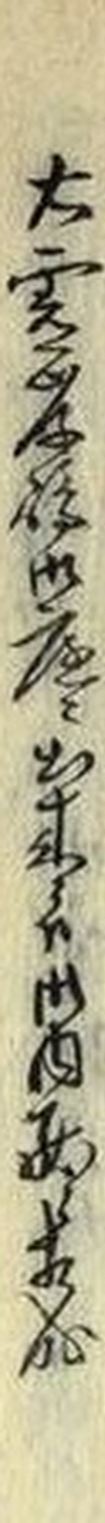右霊厳嶋御庭ニ出来ニ付御内献ニ相成
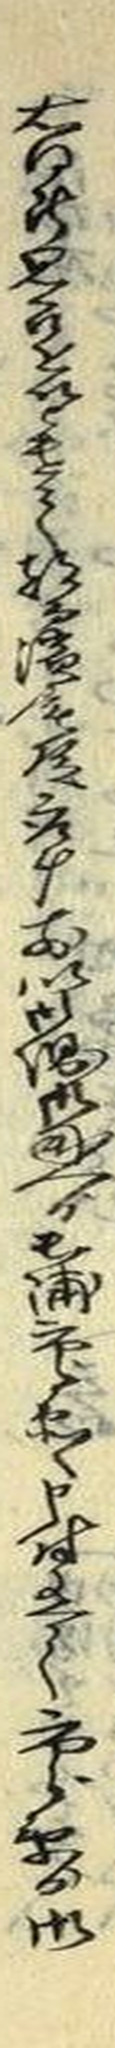右同断思召を以被遣之都而浜尾殿取計前以御側御用人ゟ出浦市郎兵衛へ申付有之市郎兵衛ゟ御
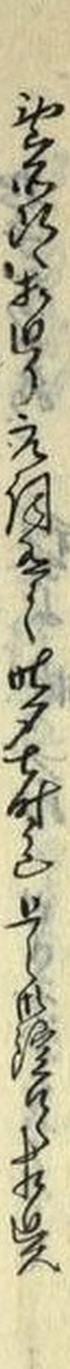台所頭へ相廻り取調有之昨夕七時過上之御錠口へ相廻ス
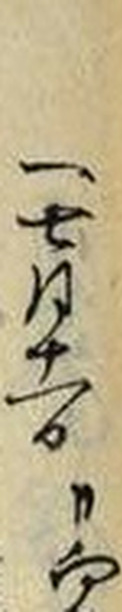一七月十一日
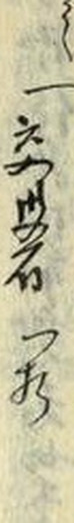交御肴一折
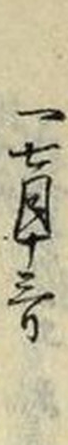一七月十一日
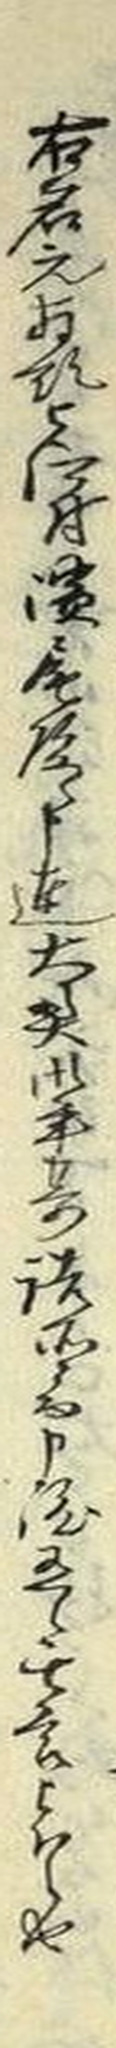右名元拝領被仰付浜尾殿へ申達大奥御年寄詰所ニ而申渡有之其節被下之候由
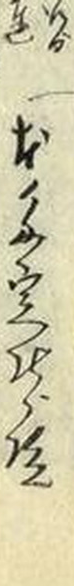本多定次郎殿
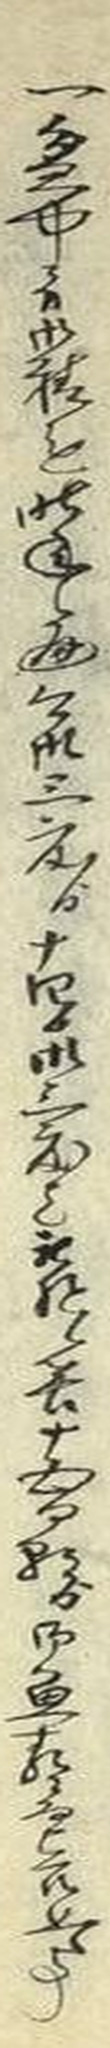一盆中ニ付御精進昨年之通今御三度ゟ十四日御三度迄被遊候筈十五日朝ゟ御魚類ニ而被召上候事
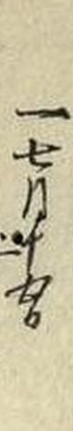一七月十一日
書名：少傅日録抄（斉善付側向頭取日記、在府）
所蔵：福井県文書館 Fukui Prefectural Archives
